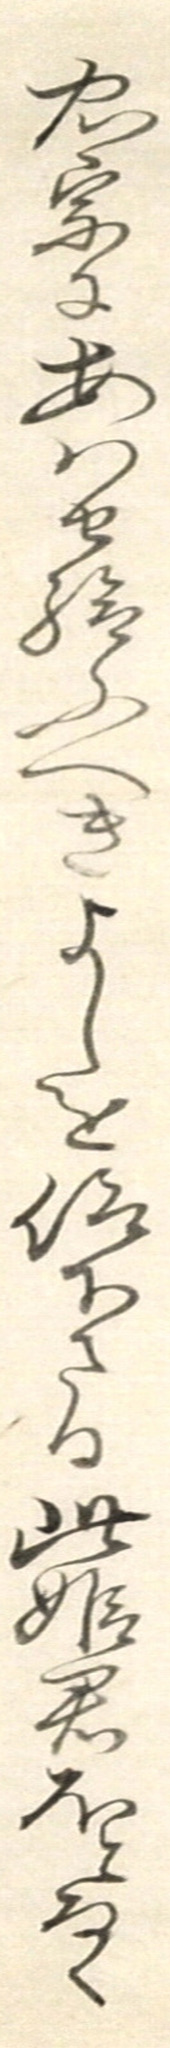忠宗にあはせ給ふへきよしを仰下さる此姫君ほとなく
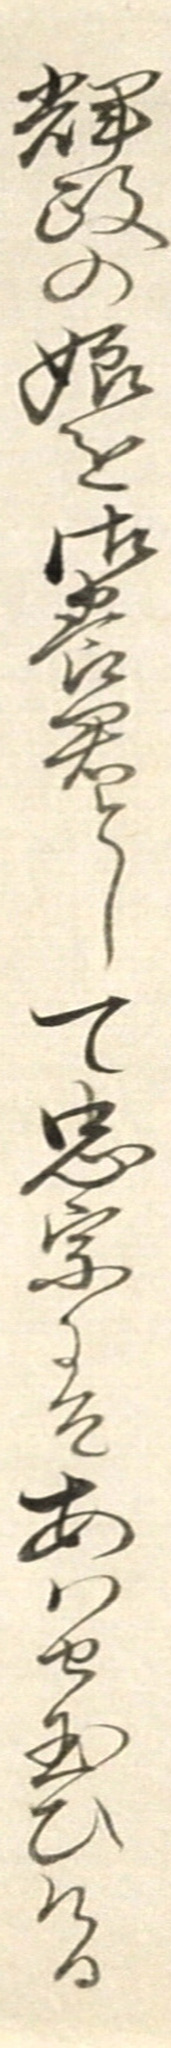輝政の娘を御養君として忠宗にそあはせ玉ひける

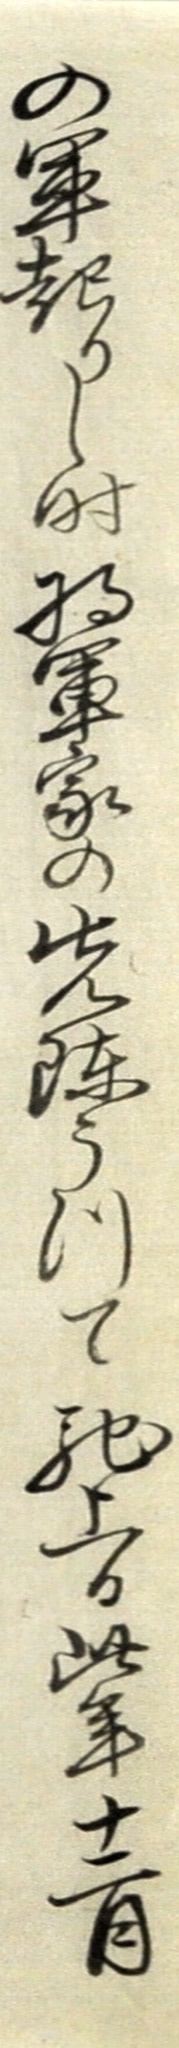の軍起りし時将軍家の先陣うつて馳上る此年十二月
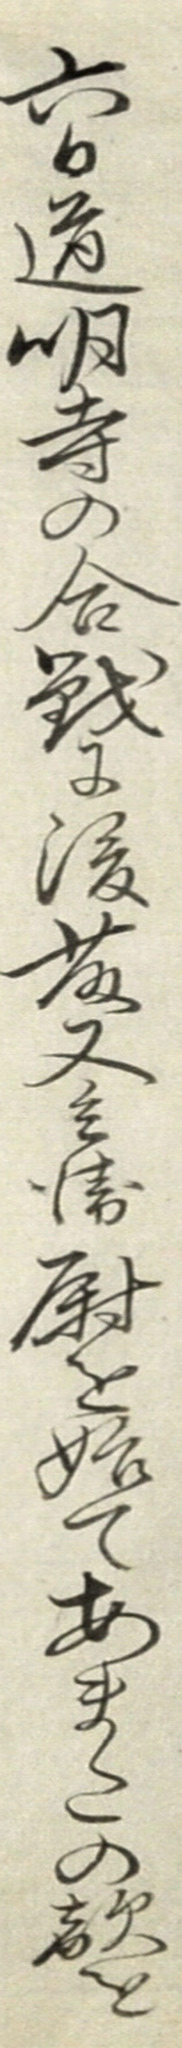六日道明寺の合戦に後藤又兵衛を始てあまたの敵を
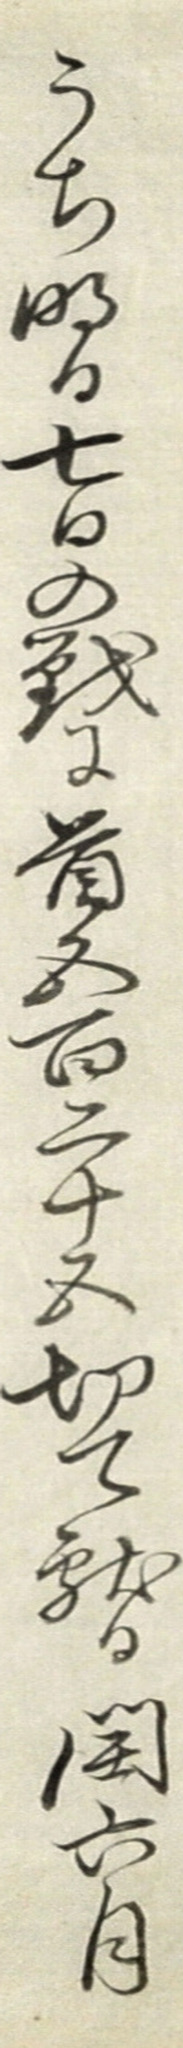うち明る七日の戦に首五百二十五切て献る閏六月
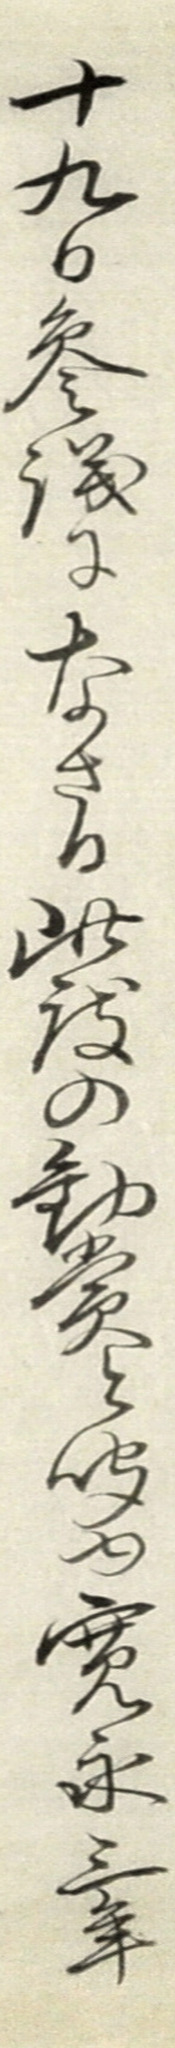十九日参議になさる此度の勧賞と聞ゆ寛永三年
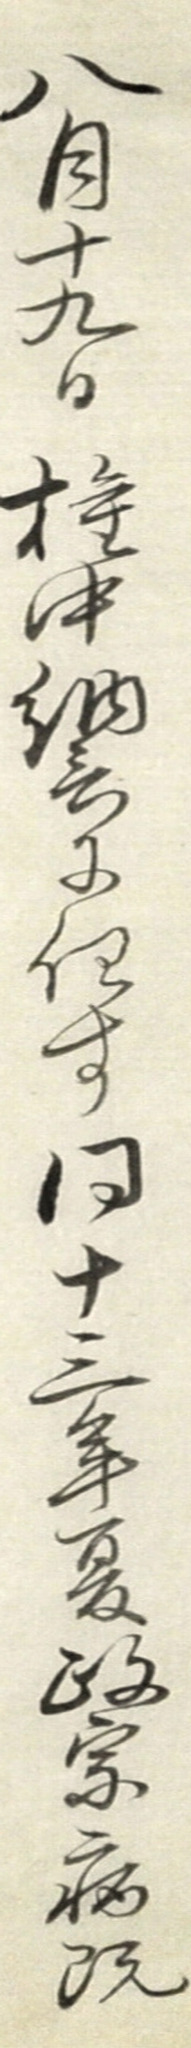八月十九日権中納言に任す同十三年夏政宗病既
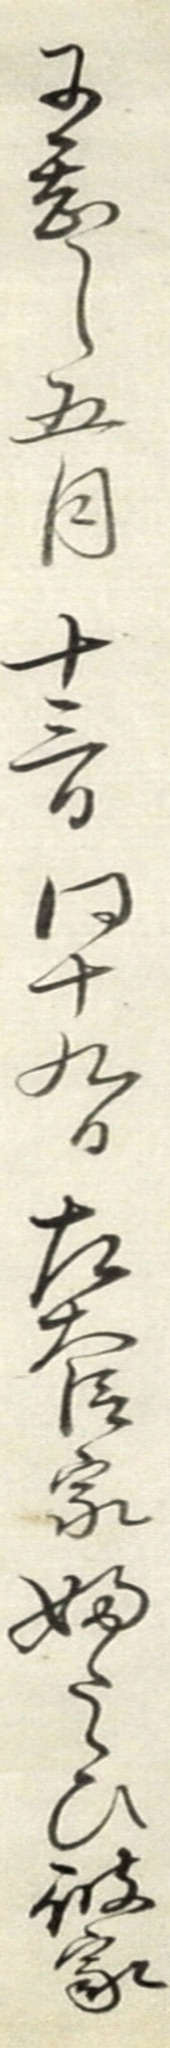に甚し五月十三日同十九日左大臣家ふたゝひ彼家
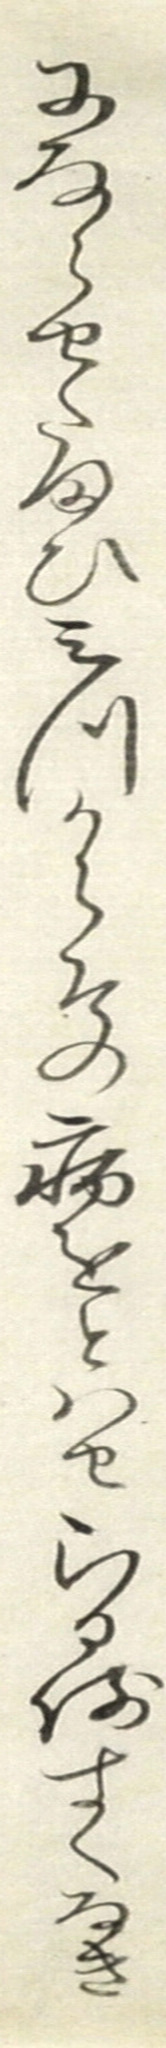にならせたまひみつからその病をとはせらるるすくなき
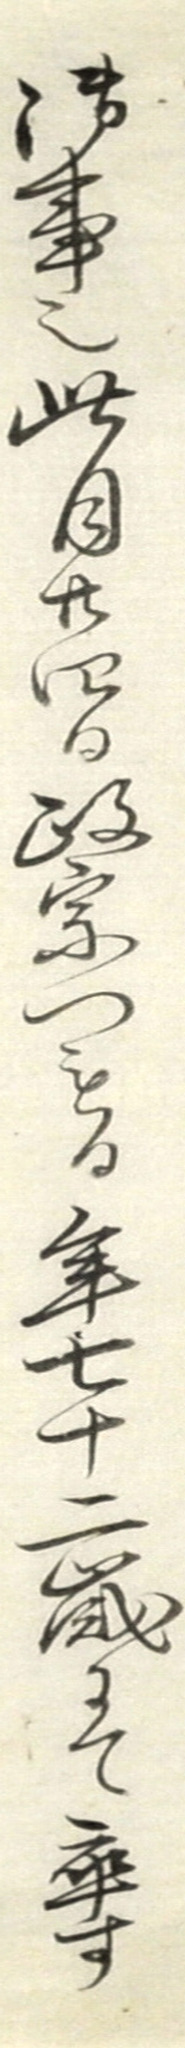御事也此月廿四日政宗つもる年七十二歳にて卒す
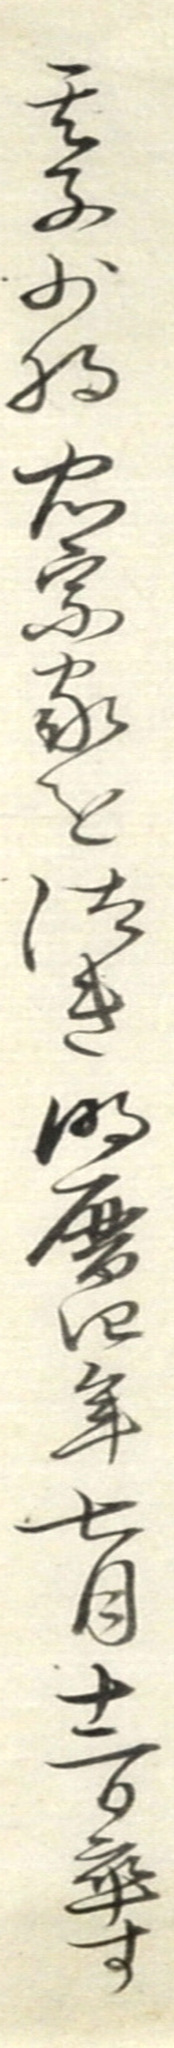其子少将忠宗家をつき明暦四年七月十二日卒す
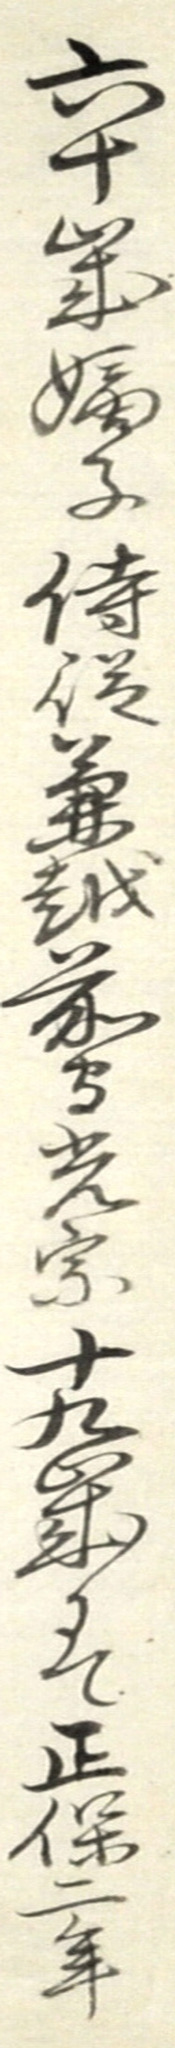六十才歳嫡子侍従兼越前守光宗十九歳にて正保二年
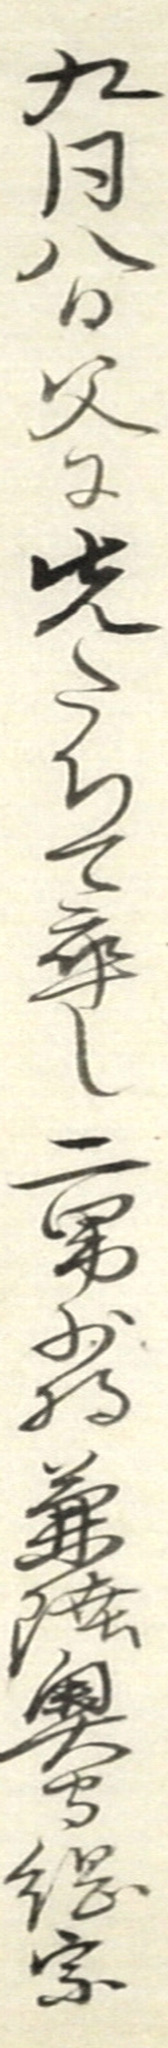九月八日父に先たちて卒し二男少将兼陸奥守綱宗
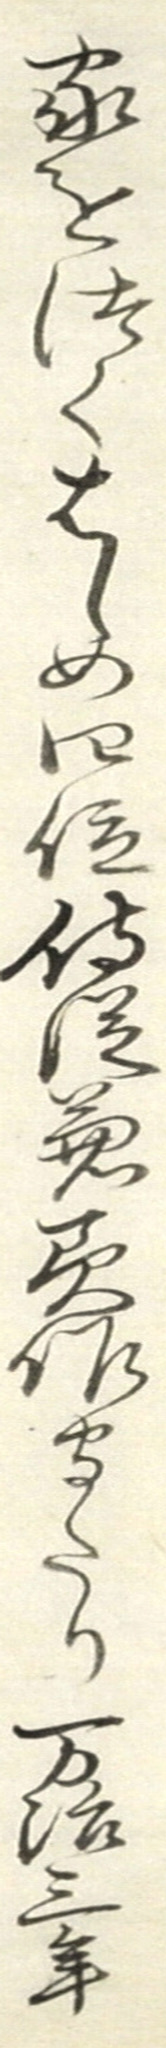家をつくはしめ四位侍従兼美作守たり万治三年
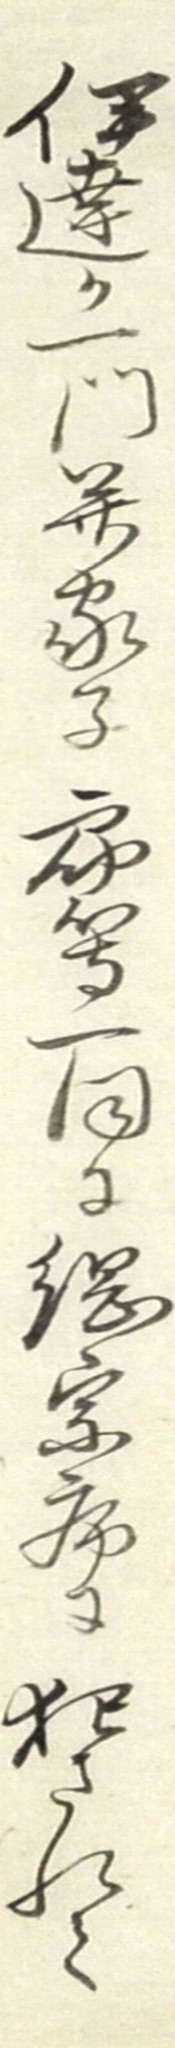伊達か一門幷家子郎等一同に綱宗病に犯されて
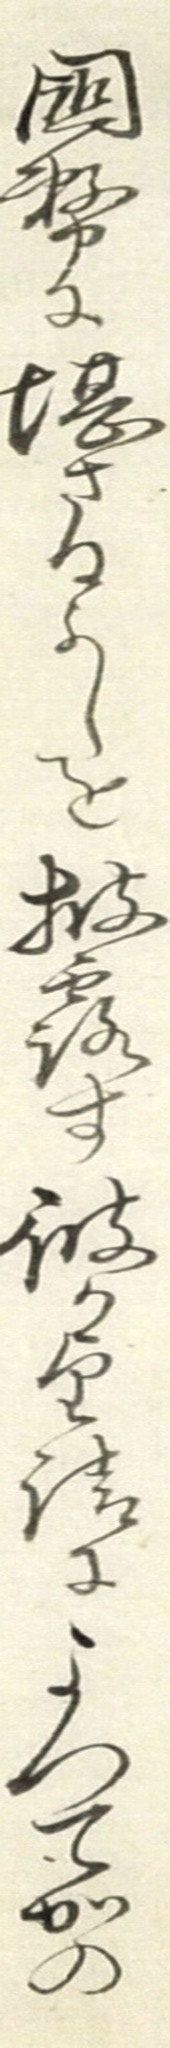国務に堪さるよしを披露す彼か望請によつてかの
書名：藩翰譜（七・下）
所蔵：伊那市立高遠町図書館・合同会社AMANE
